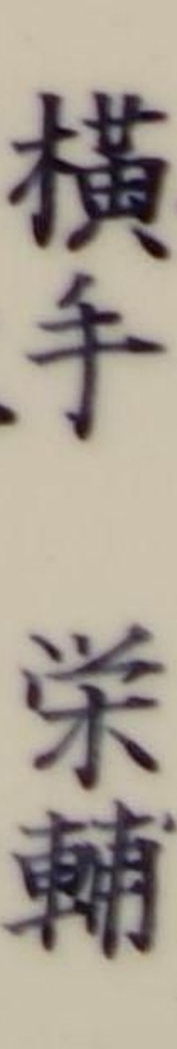横手栄輔
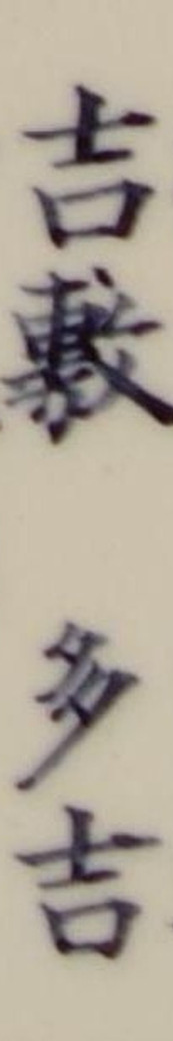吉敷多吉
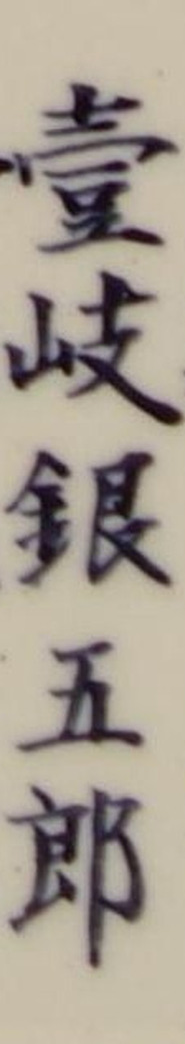壱岐銀五郎
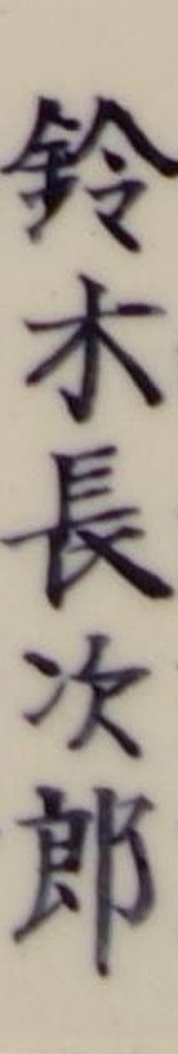鈴木長次郎
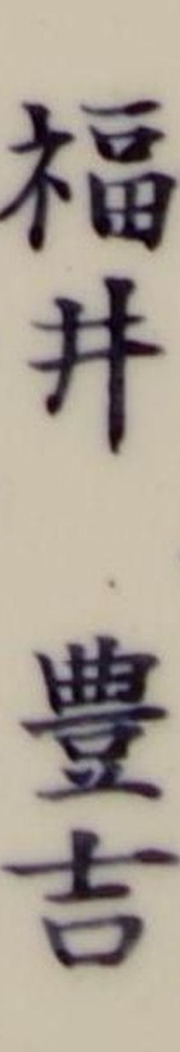福井豊吉
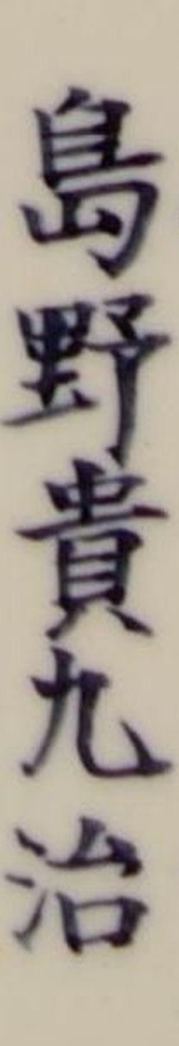島野貴九治
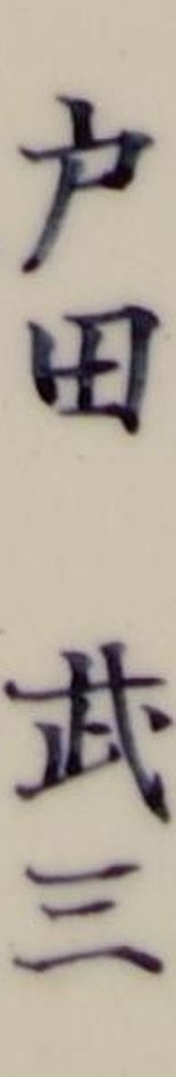戸田武三
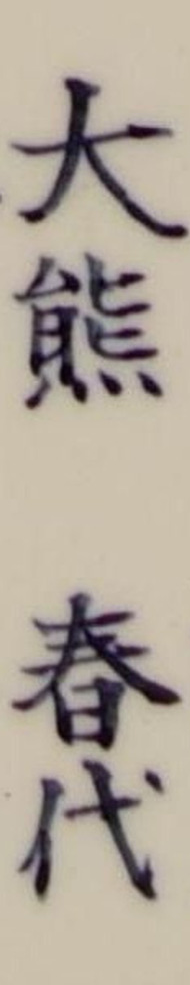大熊春代
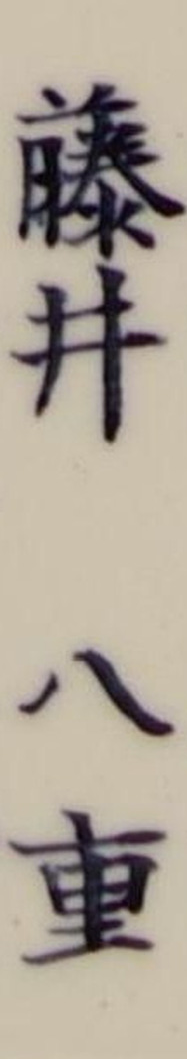藤井八重
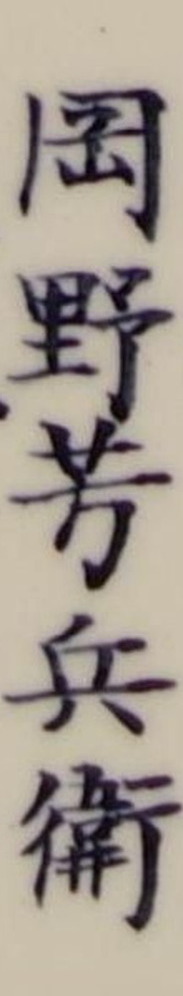岡野芳兵衛
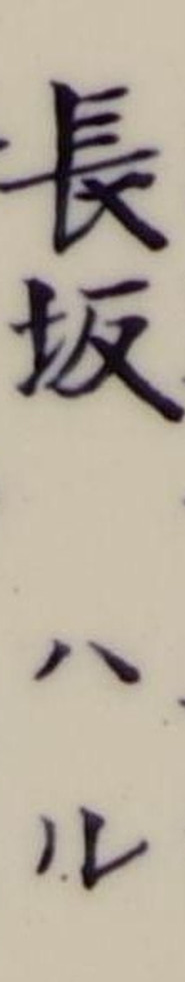長坂ハル
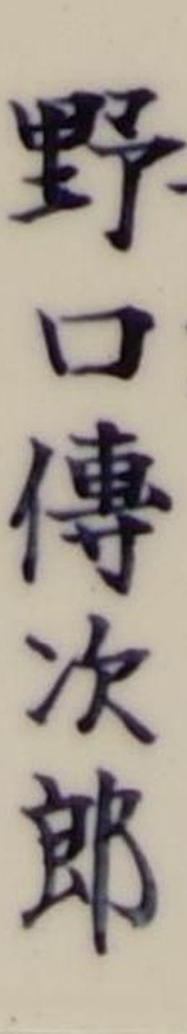野口伝次郎
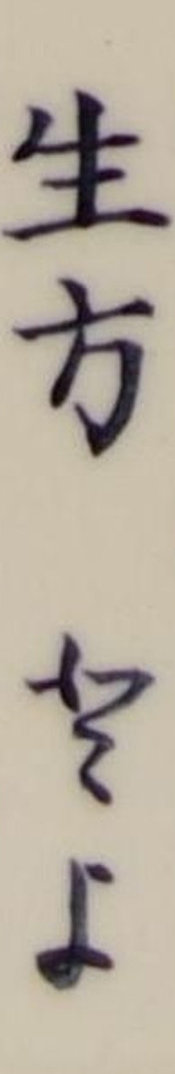生方とよ
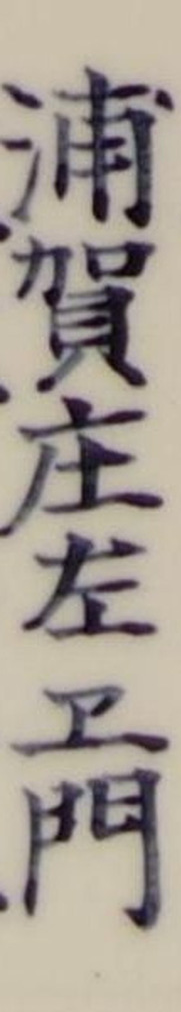浦賀庄左ヱ門
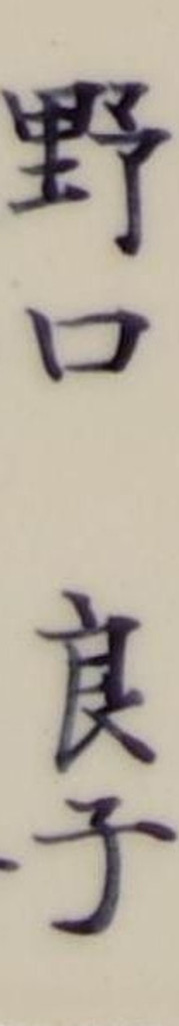野口良子
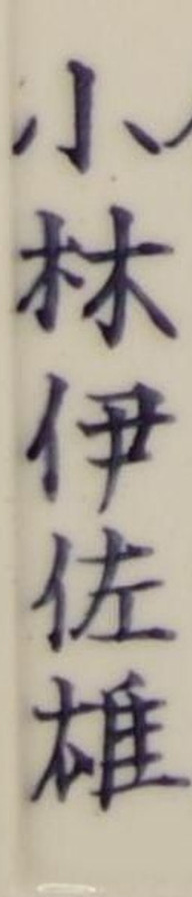小林伊佐雄
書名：M~S
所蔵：高野山金剛峯寺
